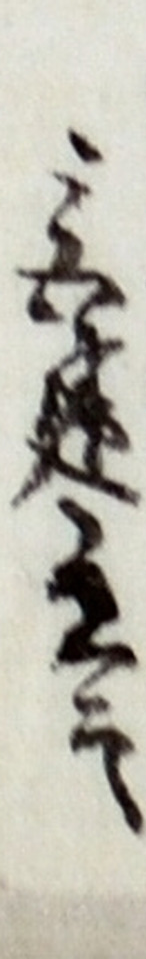宮建有之
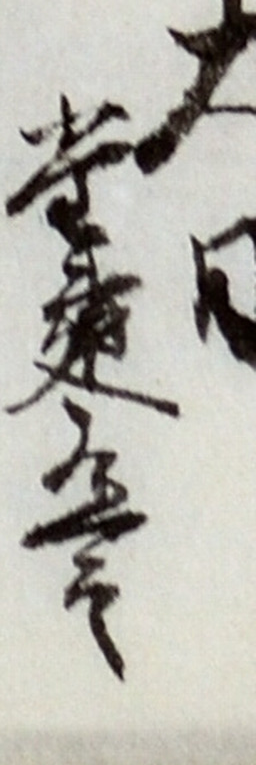堂建有之
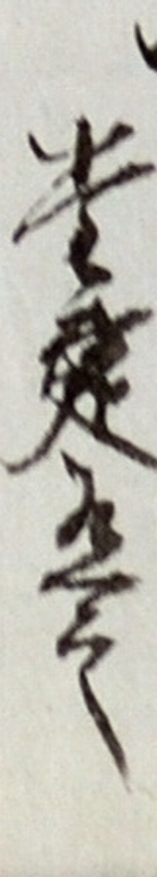堂建有之
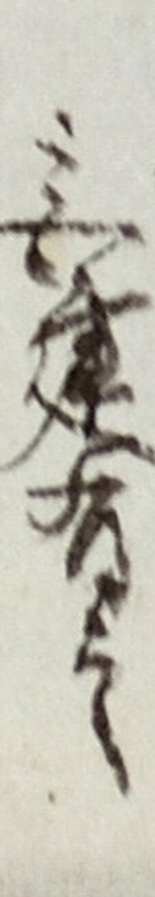宮建有之
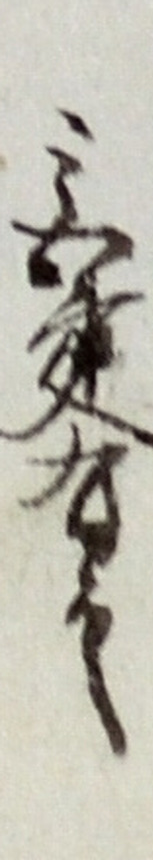宮建有之
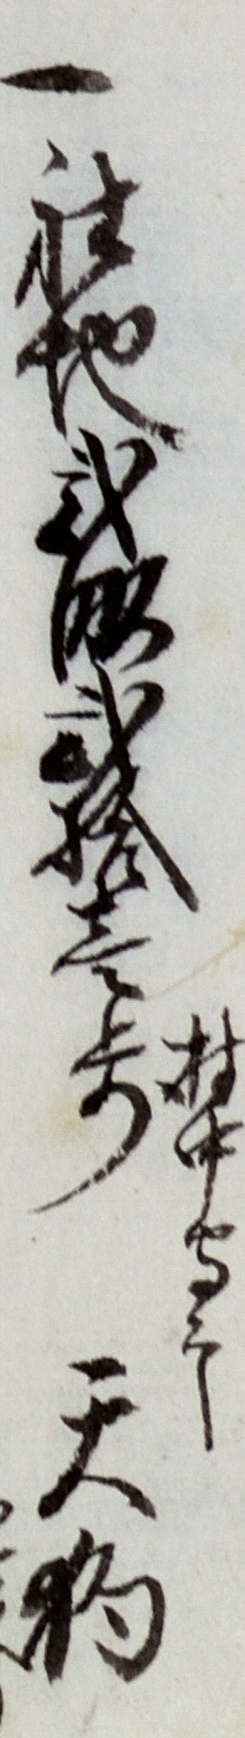一社地弐畝弐拾壱歩天狗
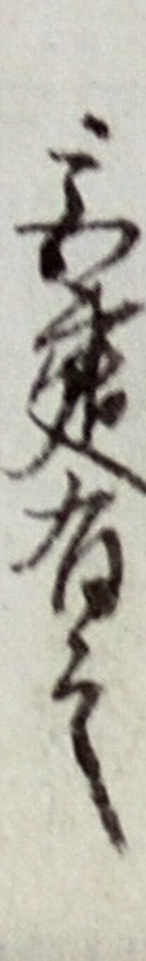宮建有之
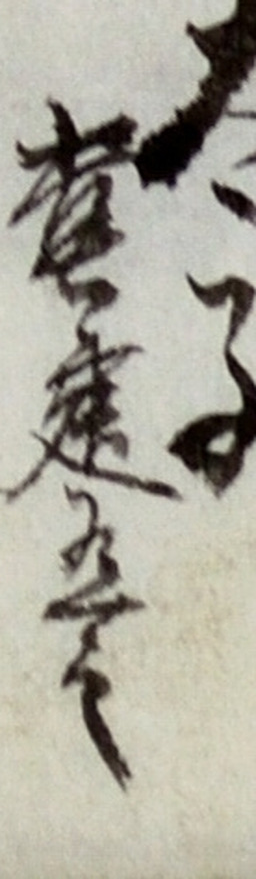堂建有之

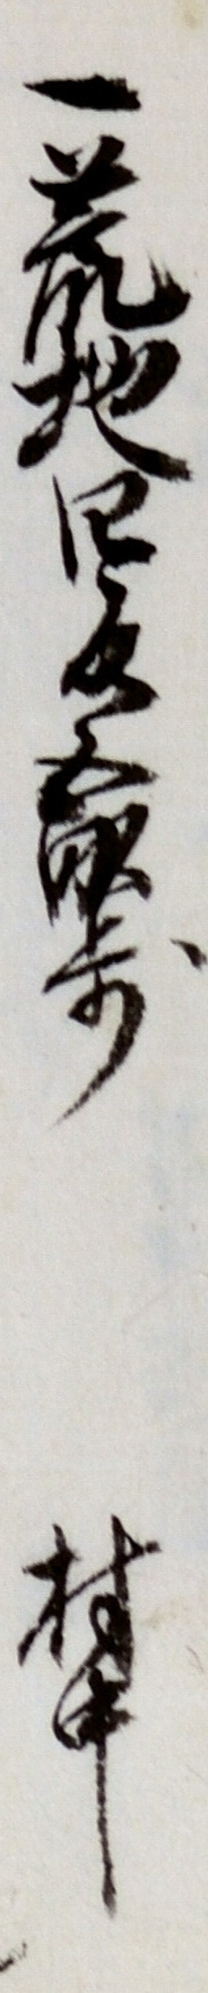一荒地四反五畝歩村中
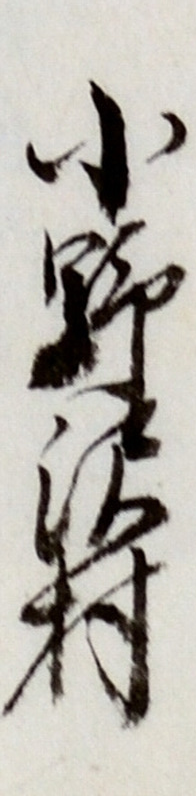小野沢村
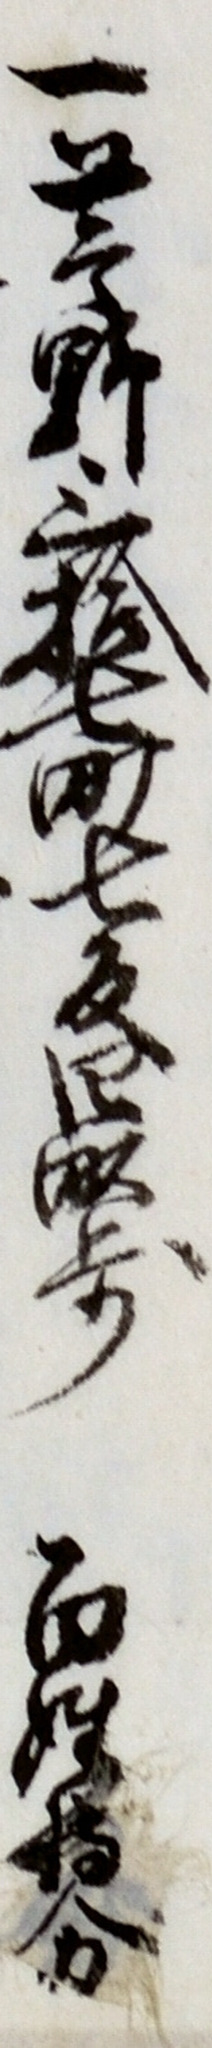一芝野三拾七町七反四畝歩百姓持分
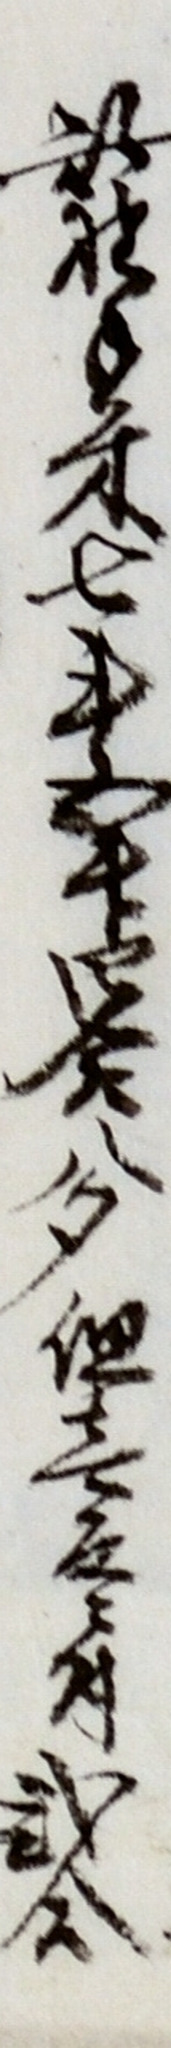此野手米七斗五升四合八勺但壱反ニ付弐合
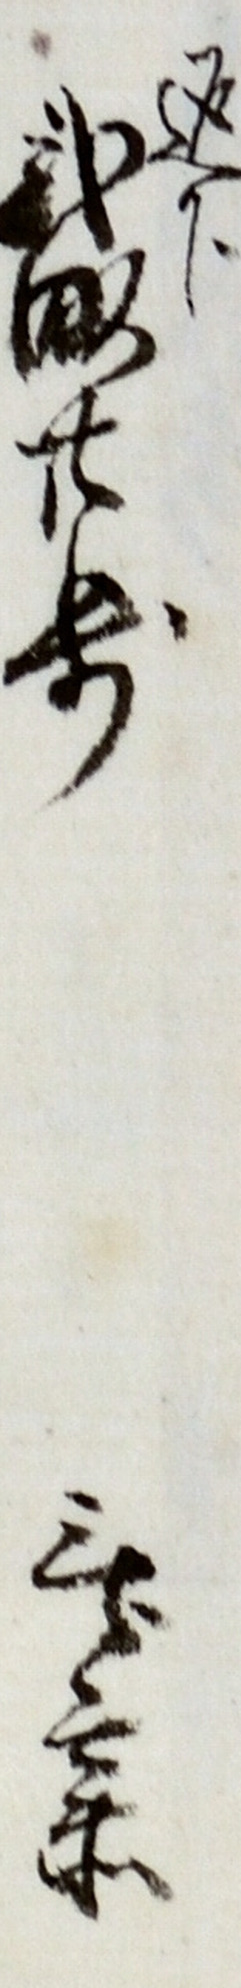弐畝廿歩三郎兵衛

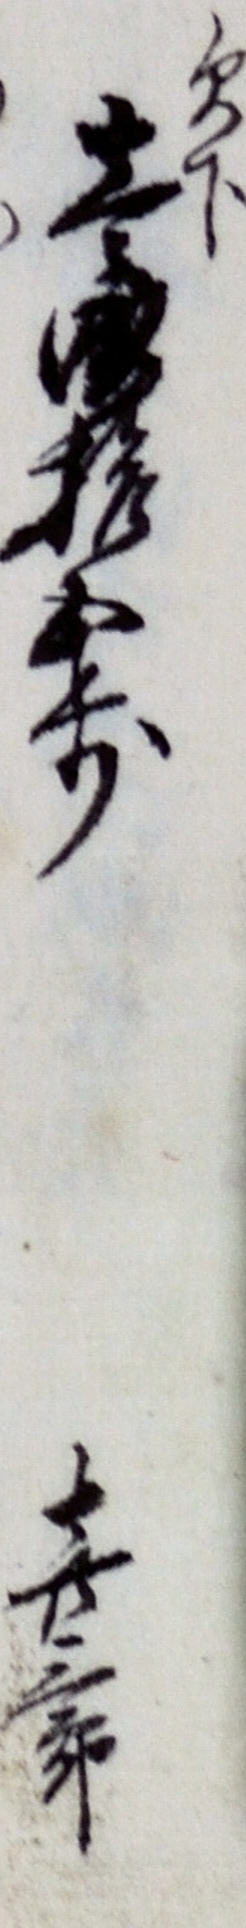壱畝拾五歩喜三郎
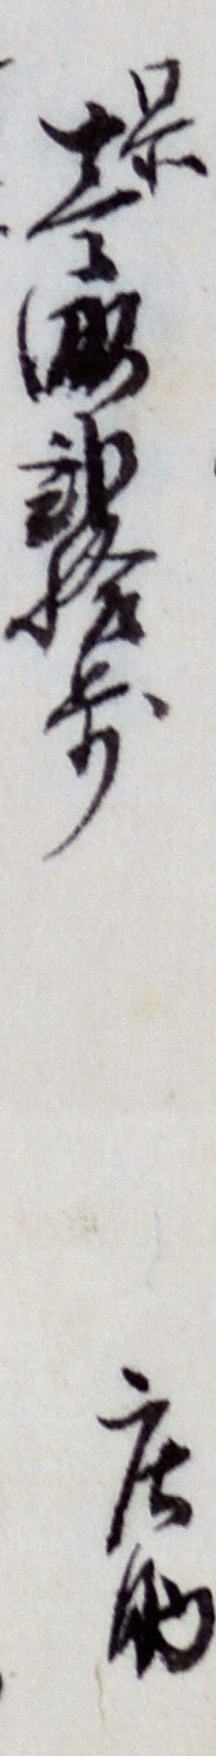壱畝弐拾歩庄助

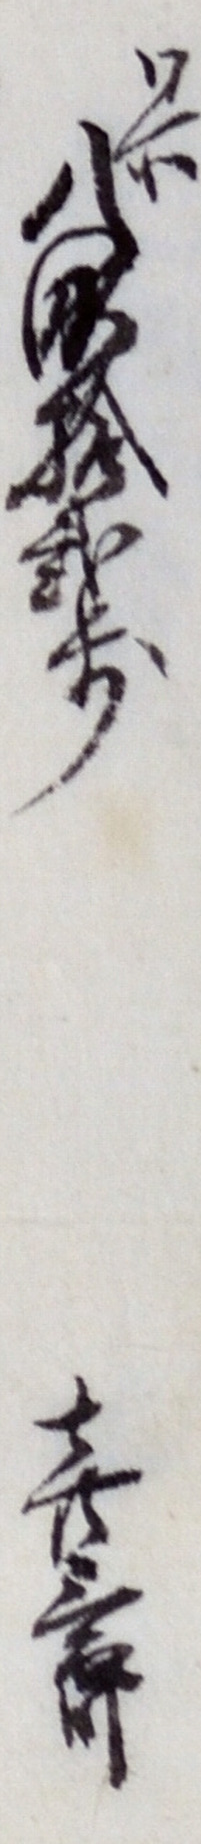八畝拾弐歩喜三郎
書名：御領分中山林社地手控
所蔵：伊那市立高遠町図書館・合同会社AMANE
